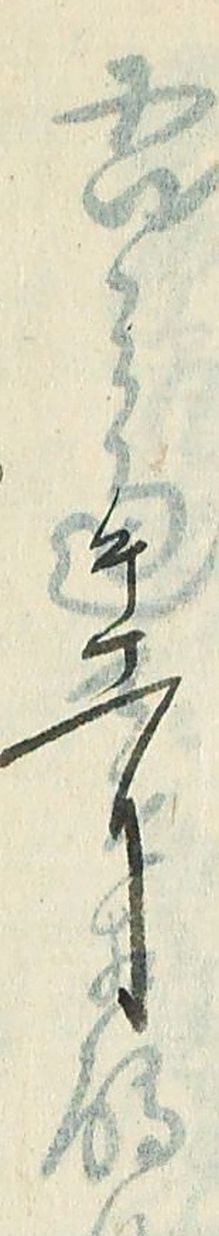午十一月
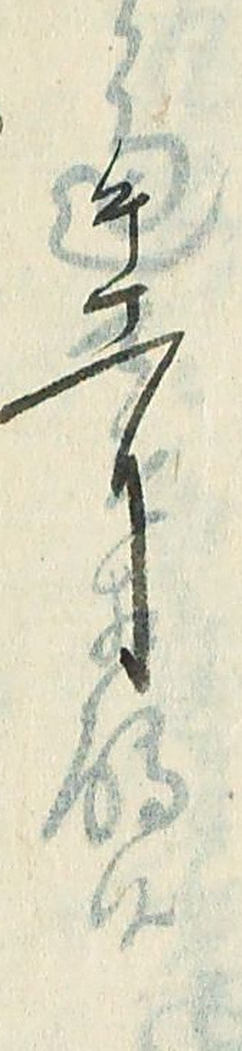午十一月
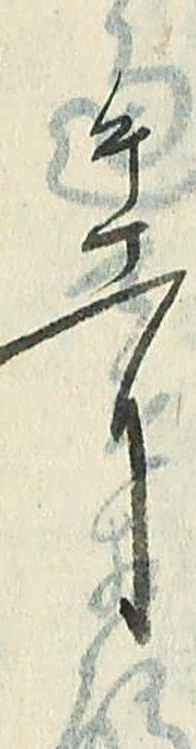午十一月
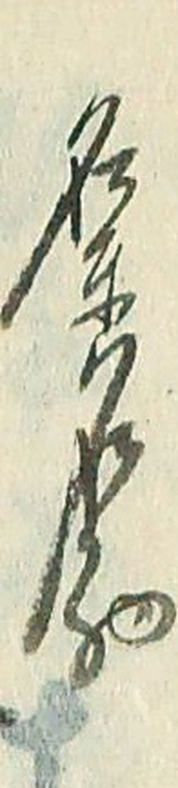名東名西
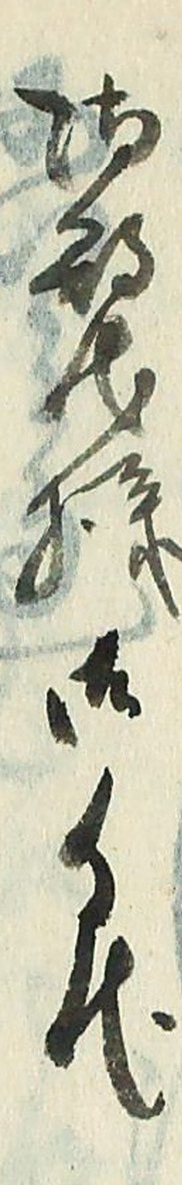御郡代様御手代
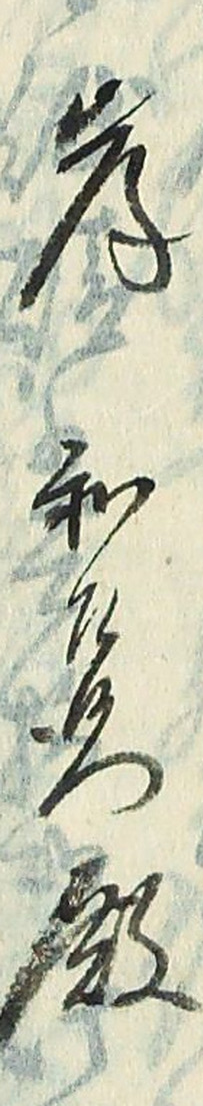岸和左衛門殿
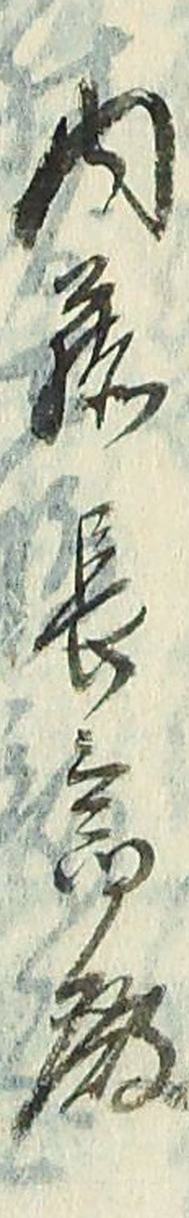内藤長三郎殿
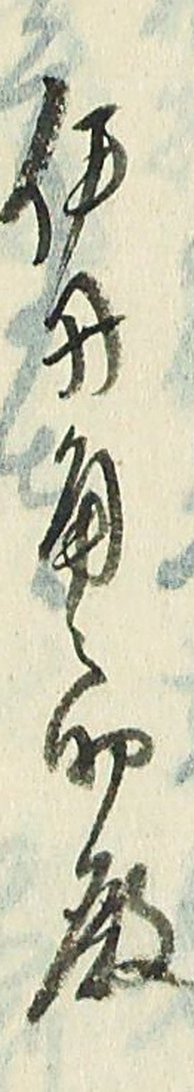伊丹角之助殿
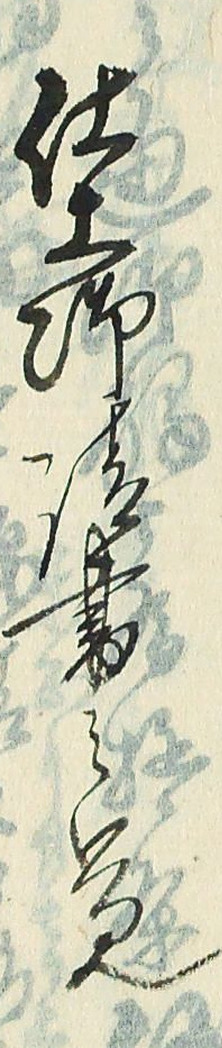仕上御請書之覚
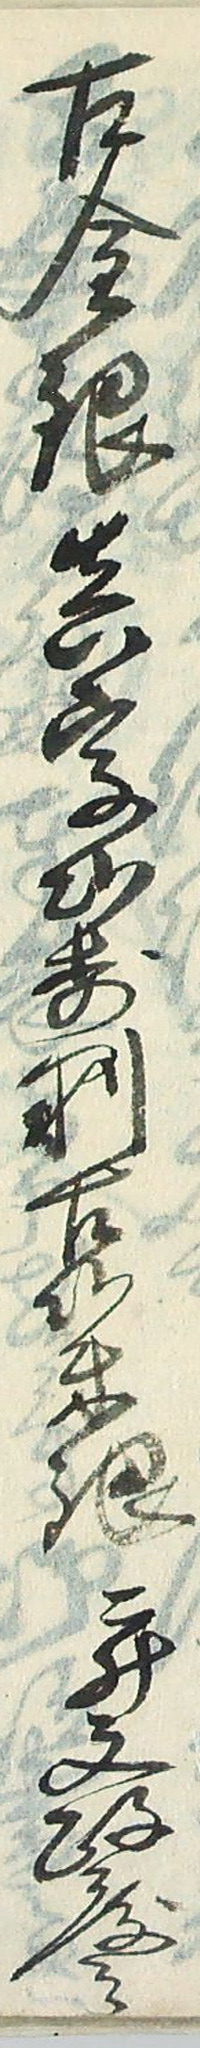古金銀真字弐歩判古弐朱銀幷文政度之
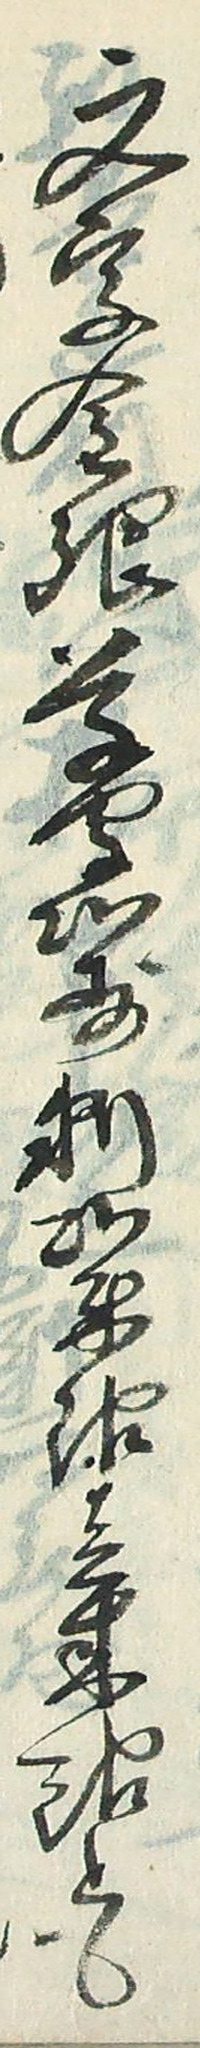文字金銀草字弐歩判弐朱銀壱朱銀とも
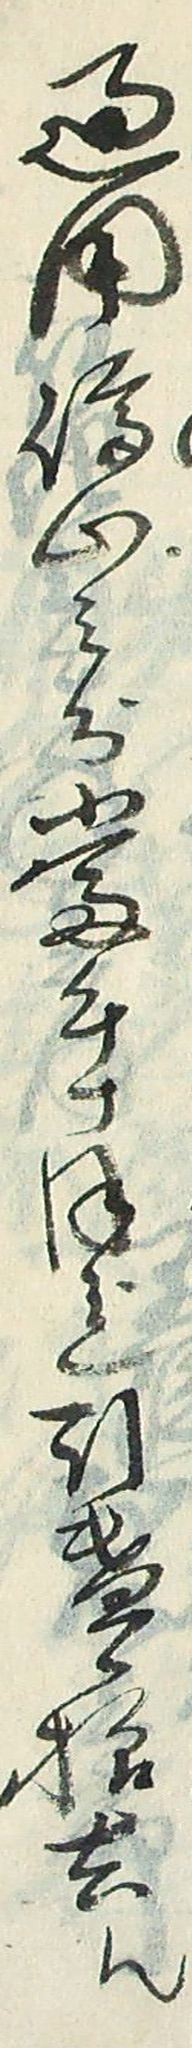通用停止之分当午十月迄引替候様去る

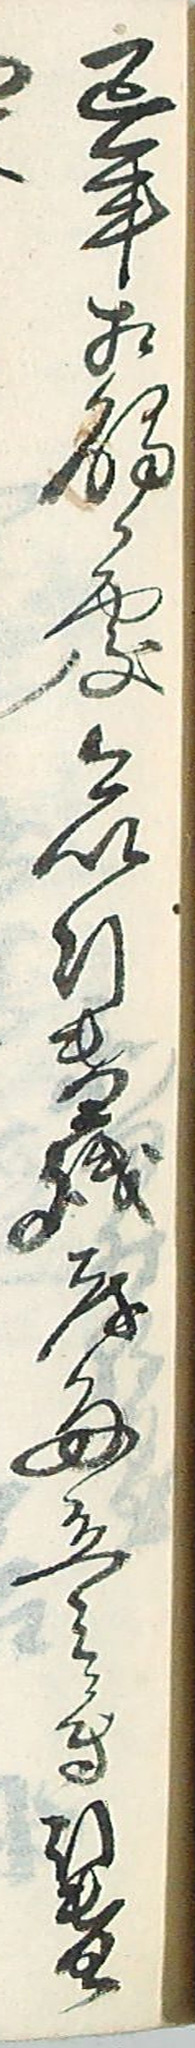巳年相触候処今以引替残も多有之に付引替
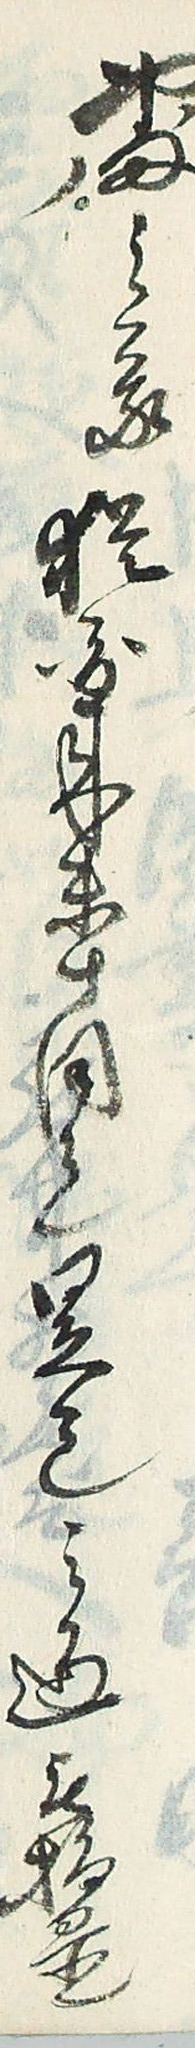処之義猶亦来未十月迄是迄之通被指置
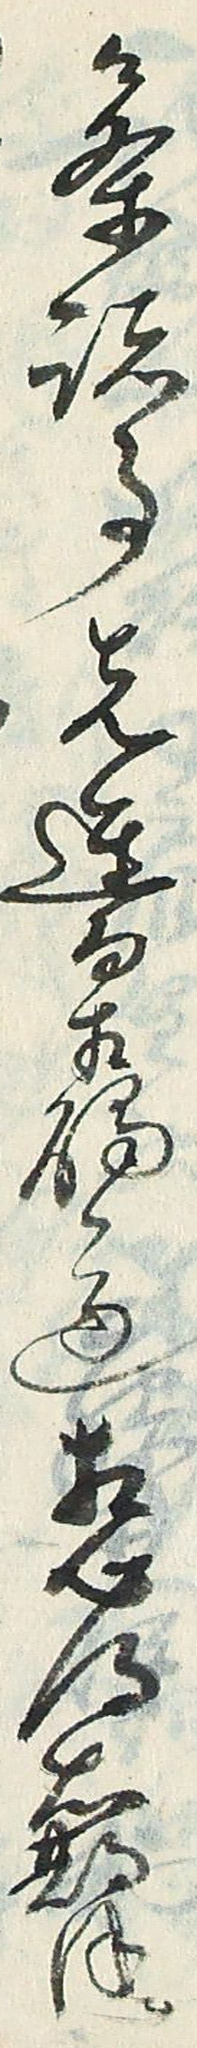候条諸事先達而相触候通相心得右期月を
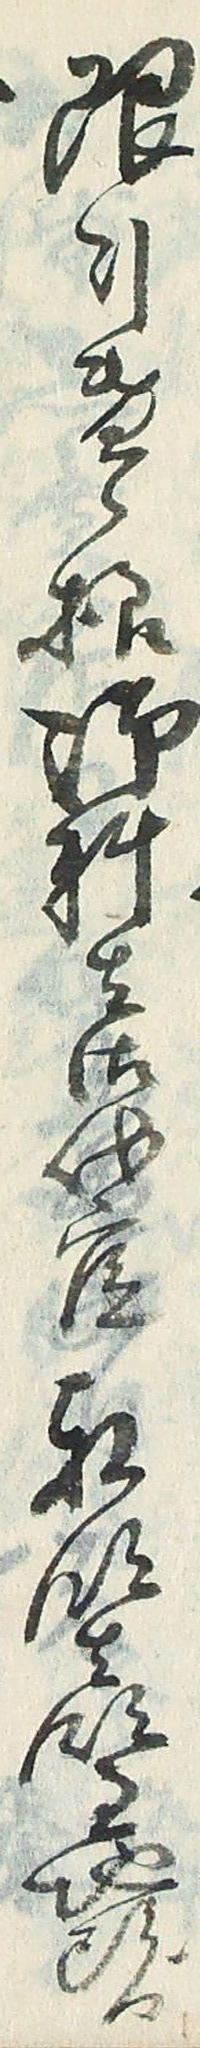限引替候様御料は御代官私領は領主地頭ゟ
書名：諸御用御□受書控
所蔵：鳴門教育大学 Naruto University of Education
